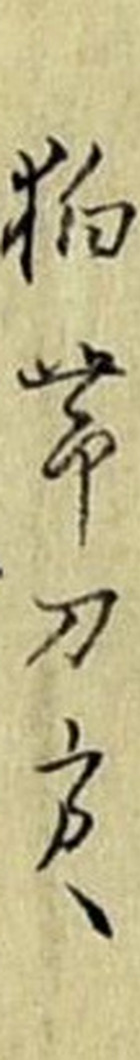狛帯刀方へ
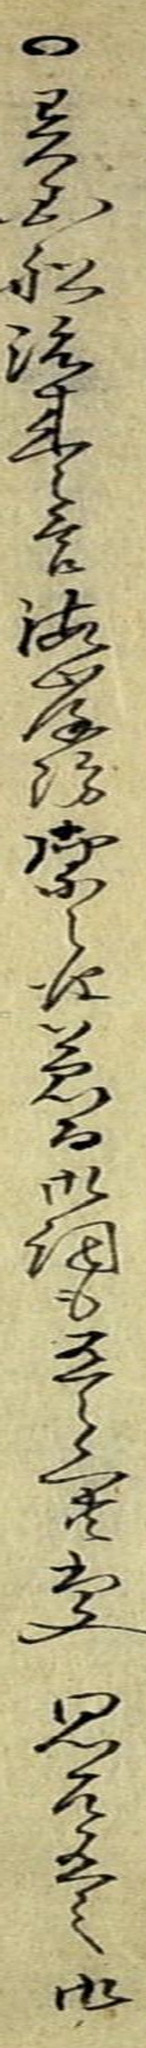○異国船渡来之節海岸防禦之儀兼而御調も有之候へ共尚又思召有之御
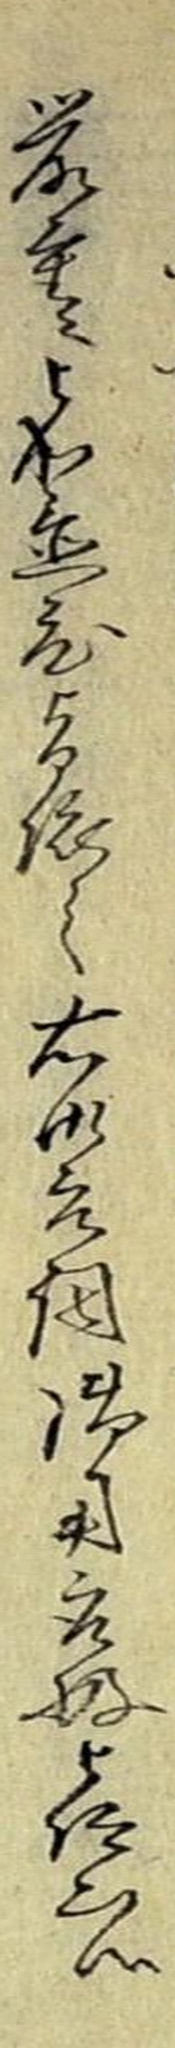厳重に被成置旨依之右御取調御用取扱被仰出候
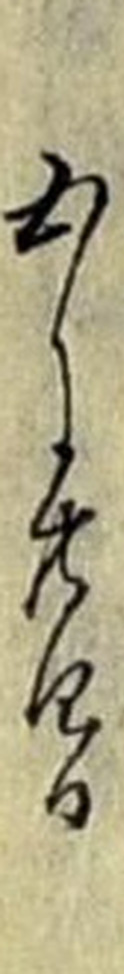五月廿四日
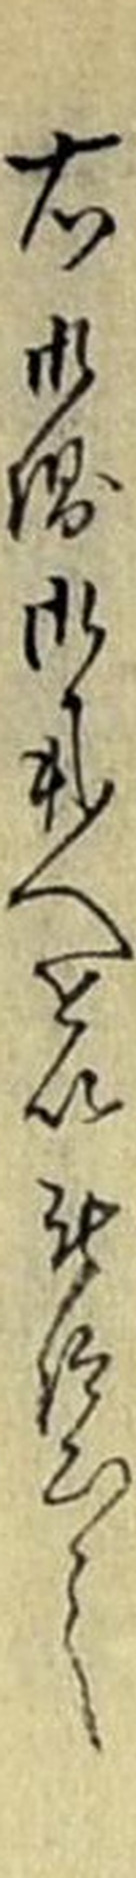右御側御用人を以被仰出之
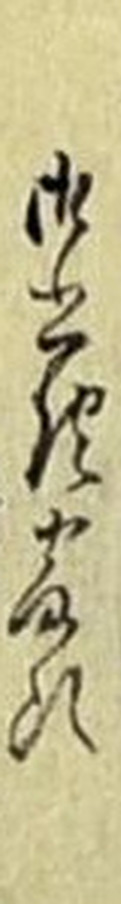御書院番頭
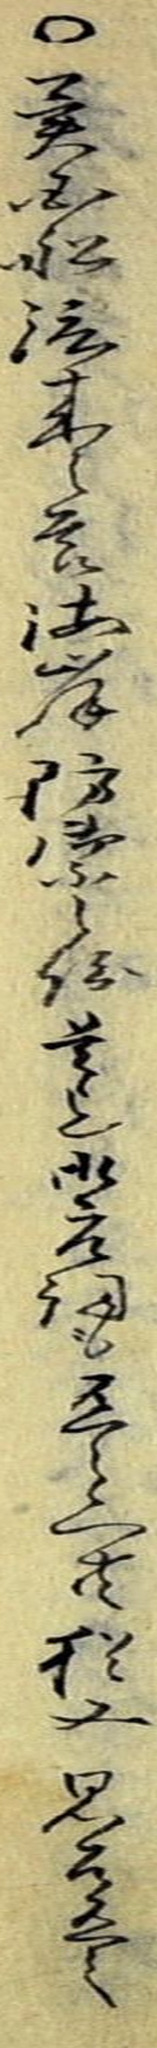○異国船渡来之節海岸防禦之儀是迄御取調も有之候へ共猶又思召有之

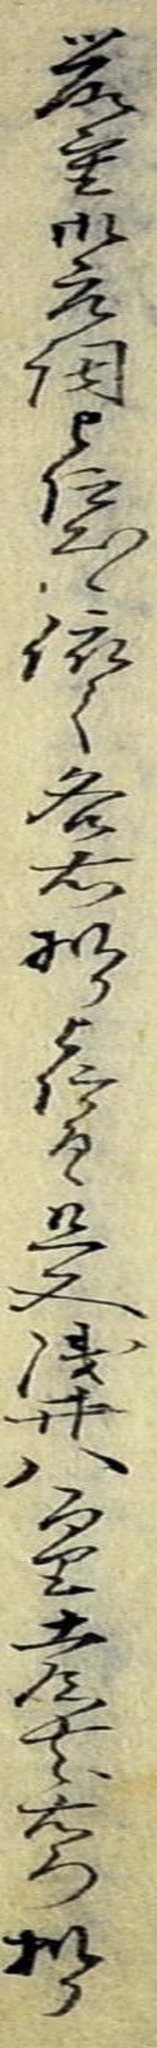厳重御取調被仰出候依之各右掛り被仰付候且又浅井八百里土屋十郎右衛門掛り
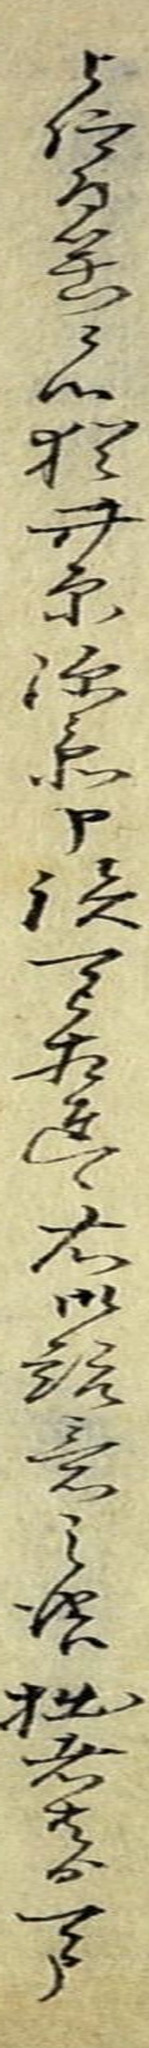被仰付筈に候猶井原源兵衛申談可被相達候右御趣意之儀は拙者共ゟ可申
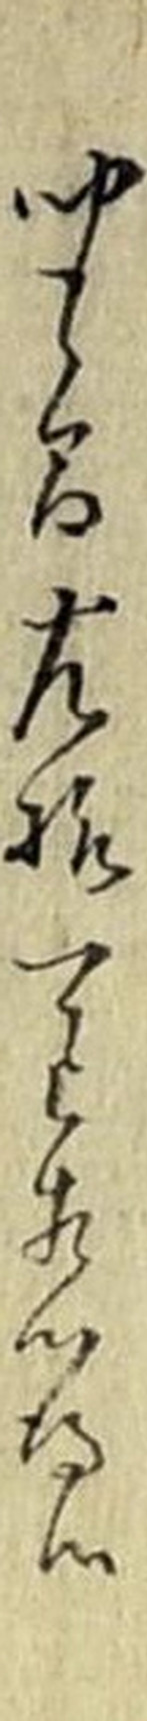聞候間左様可被相心得候
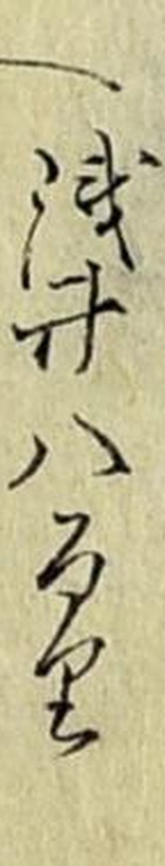浅井八百里
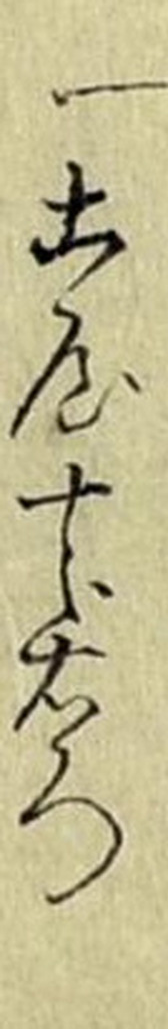土屋十郎右衛門
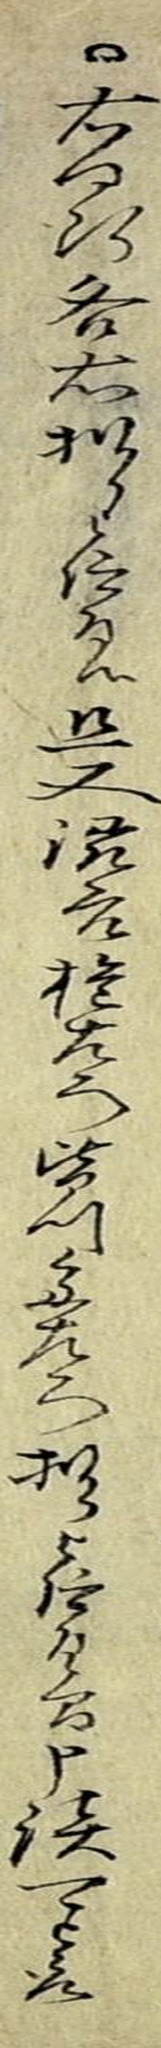○右同断各右掛り被仰付候且又渋谷権左衛門皆川多左衛門掛り被仰付候間申談可被取
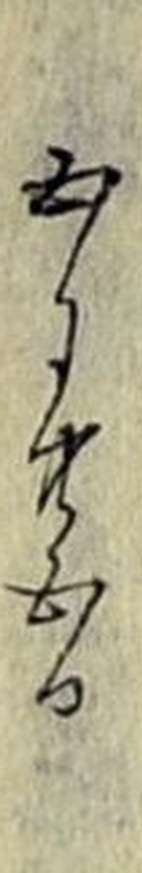五月廿五日
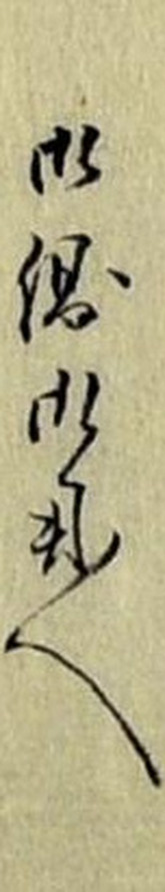御側御用人
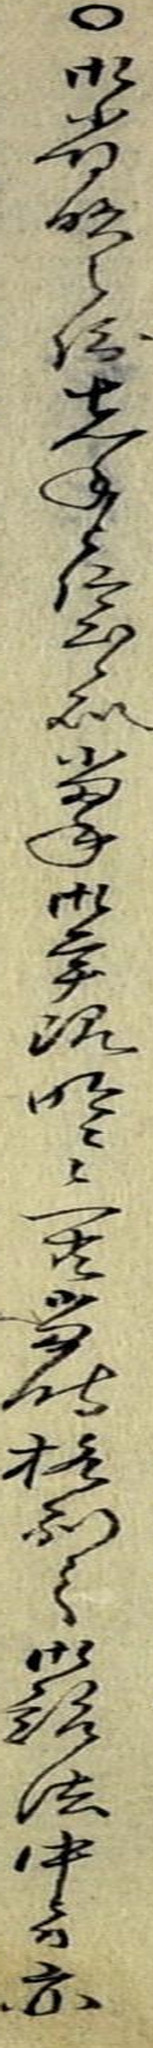○御省略之儀先年被仰出候処当年御年限明に候へ共当時格別之御趣法中に付亦
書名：命令之部 六
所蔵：福井県文書館 Fukui Prefectural Archives
